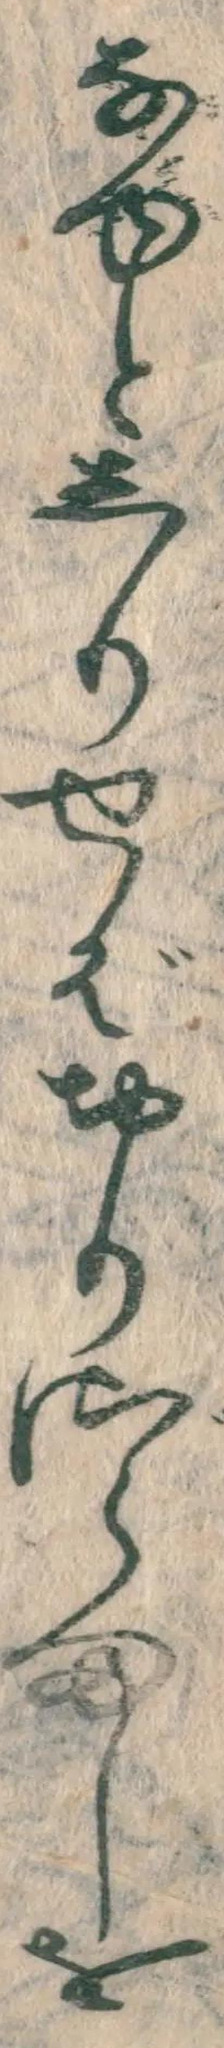なゆとしりせばおもざらましを

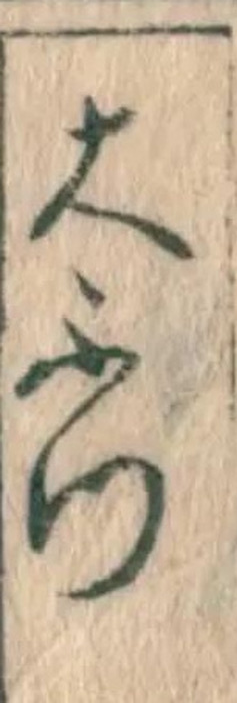大ふ門
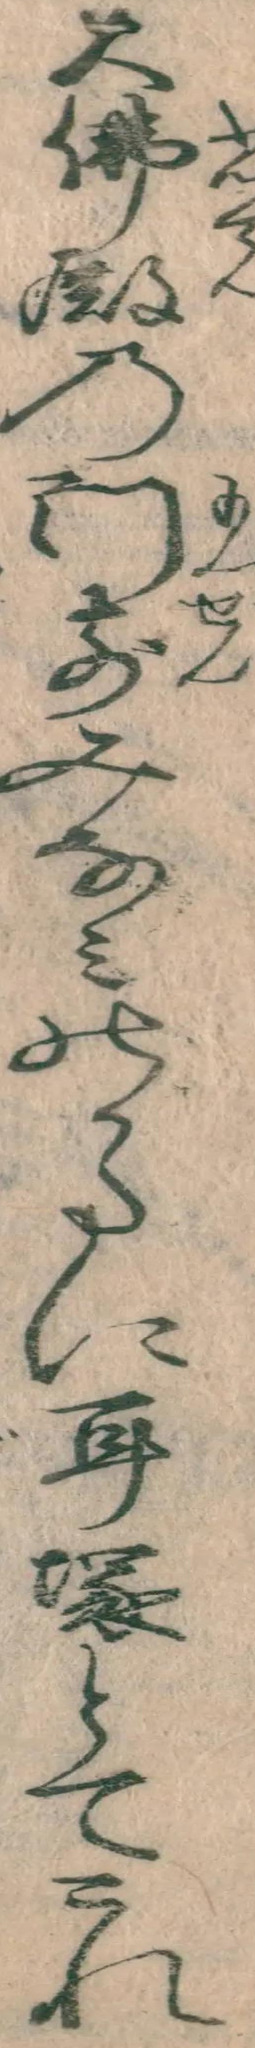大佛殿の門前みなみのかたに耳塚とてこれ
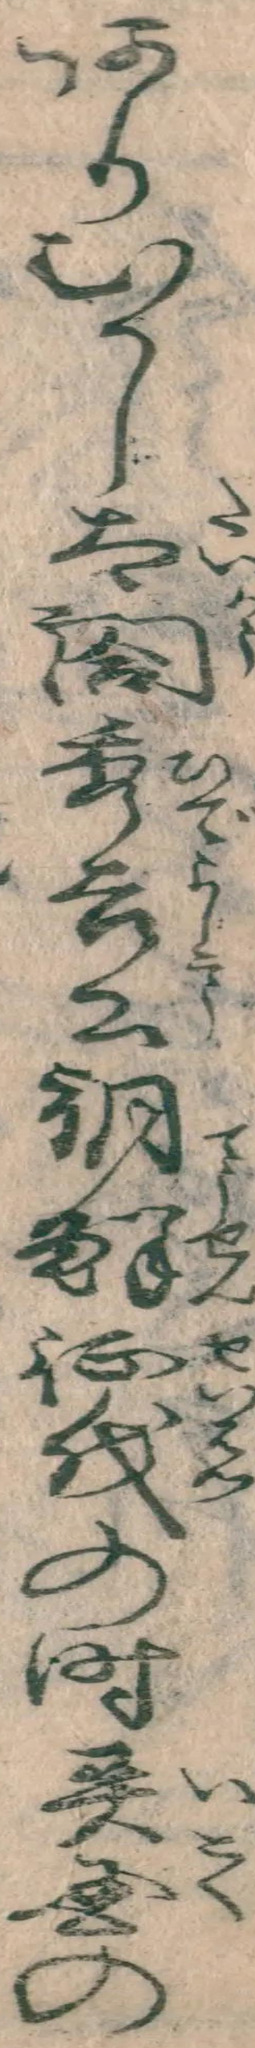ありむかした太閤秀吉公朝鮮征伐の時異国の
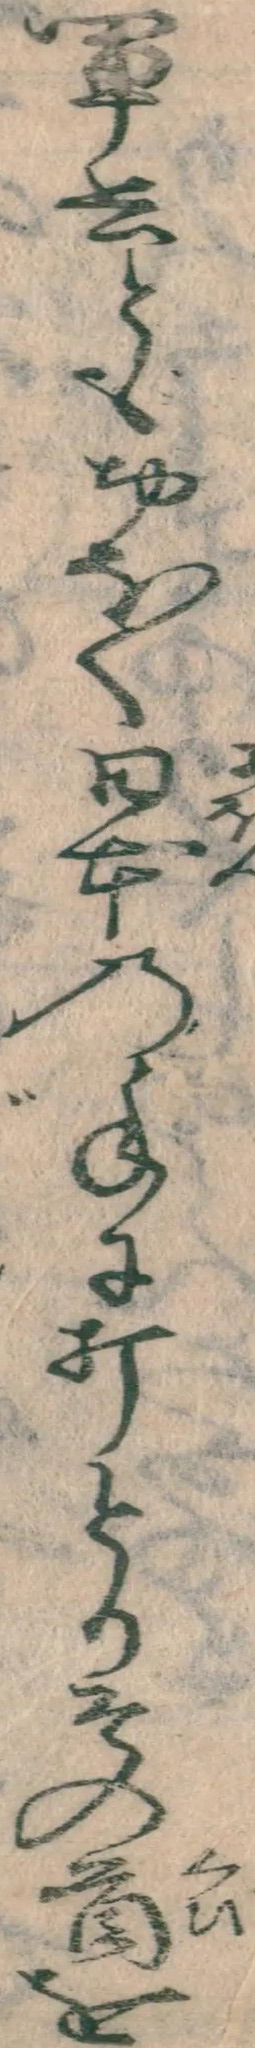軍兵ともおほく日本の手に打とりその首を
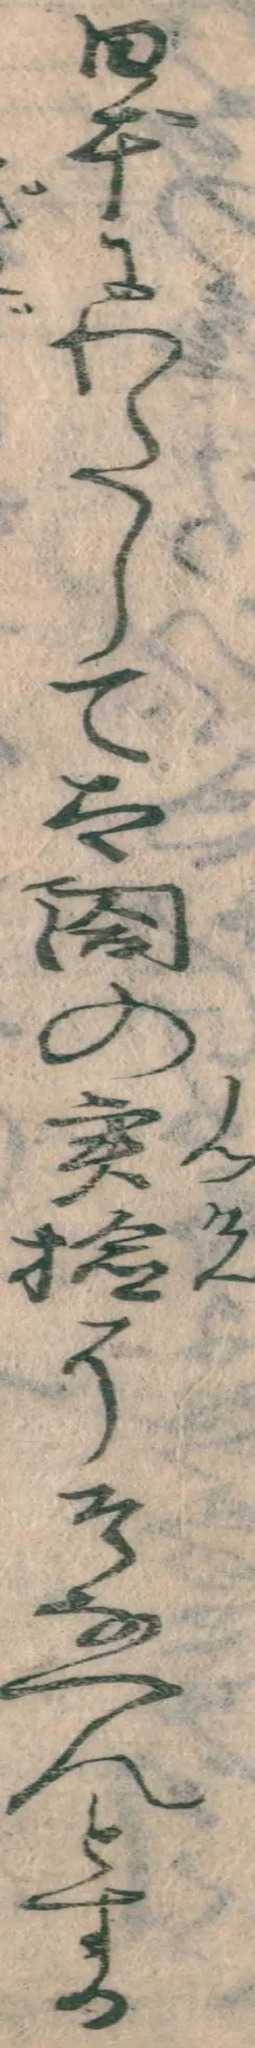日本にわたして太閤の実検にそなへんとする
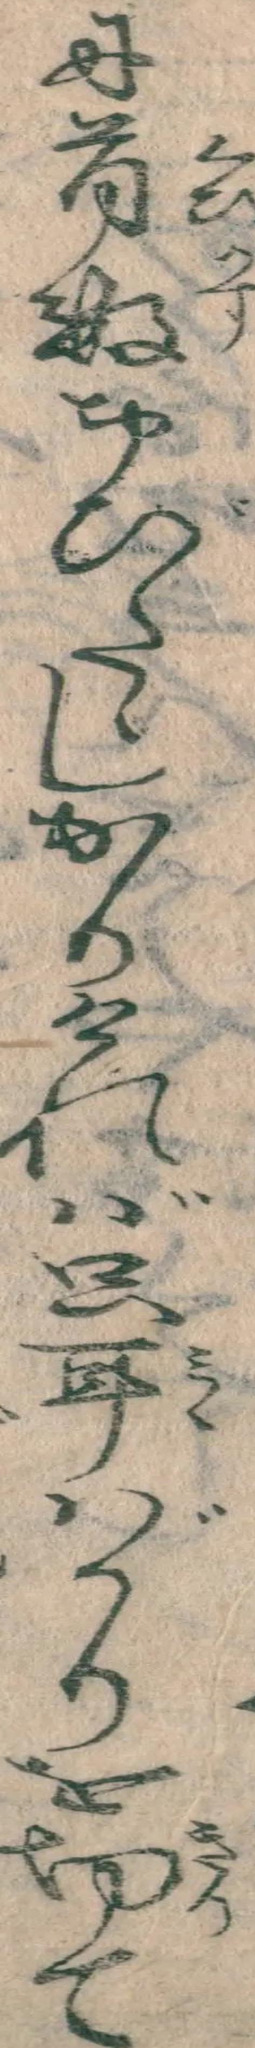に首数おひたゝしかりければ只耳ばかりを切て
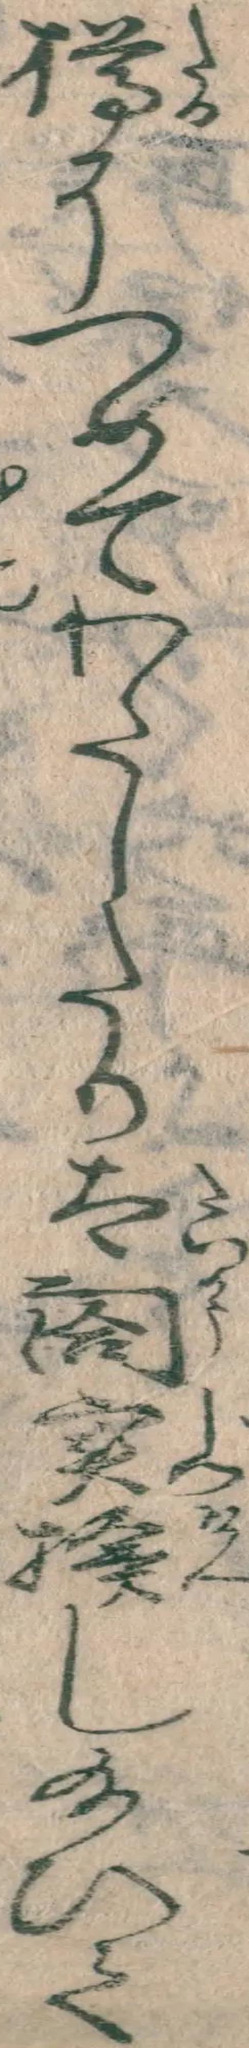樽につめてわたしたり太閤実検し給ひて
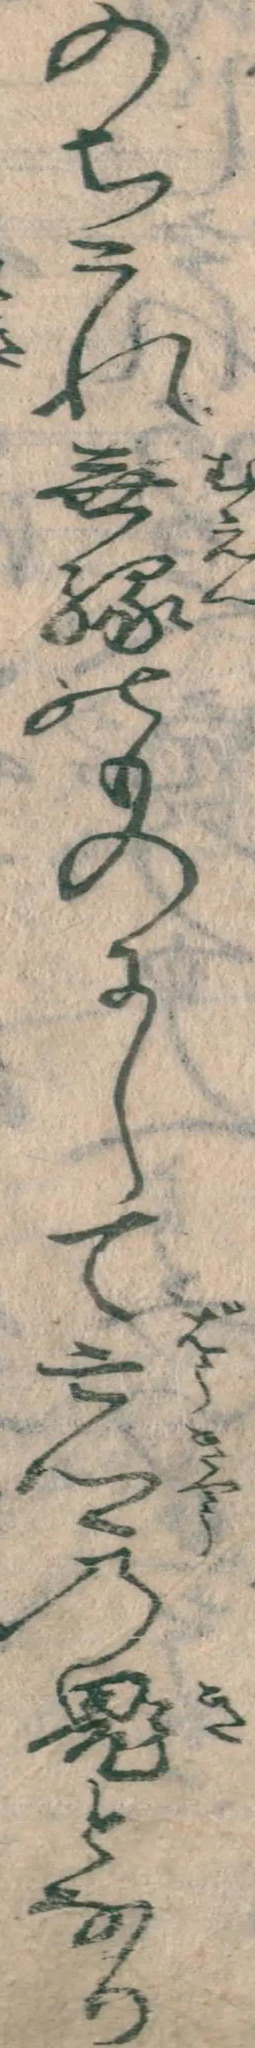のちこれ無縁のものにして亡郷の鬼となり
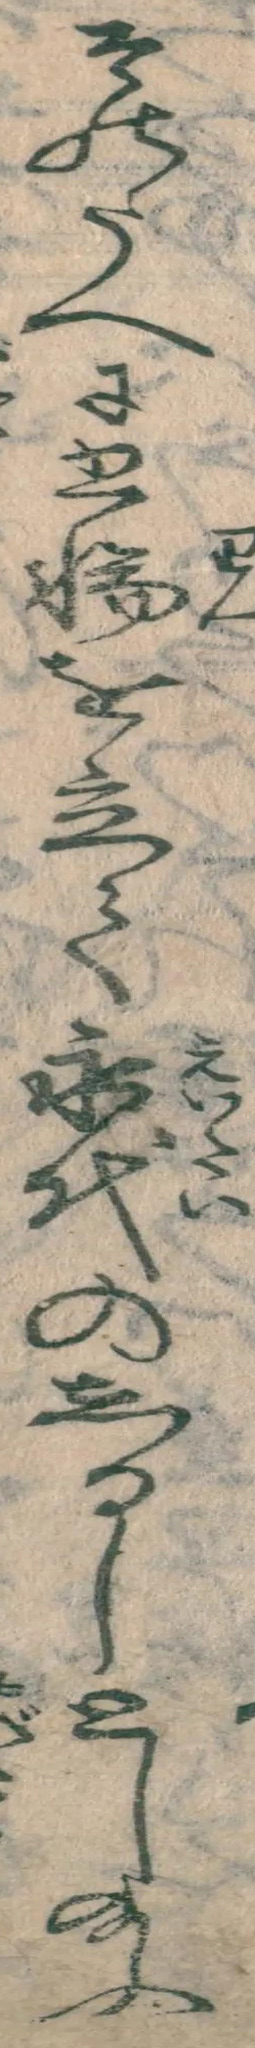そのうへに五輪を立て永代のしるしとし給ふ
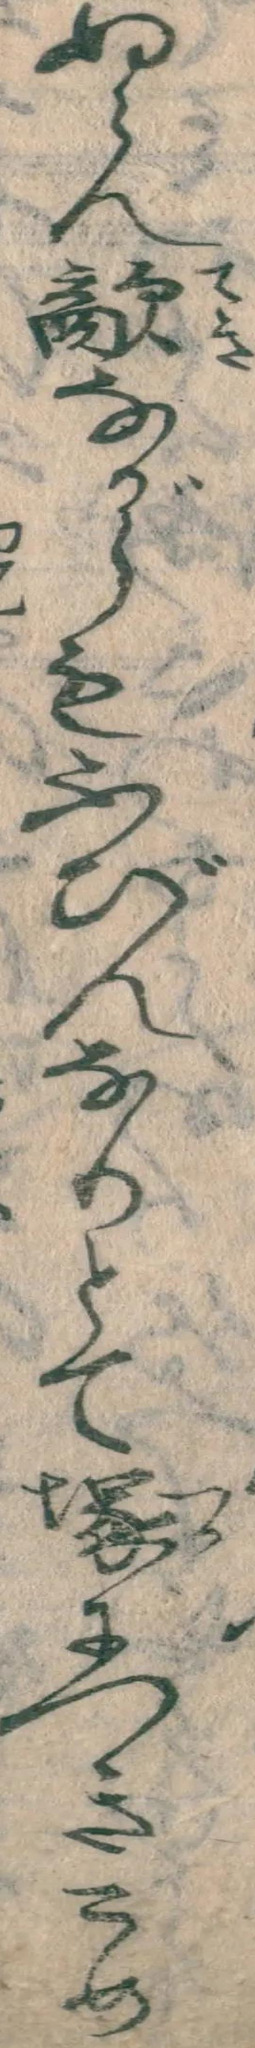ぬらん敵ながらもふびんなりとて塚につきこめ
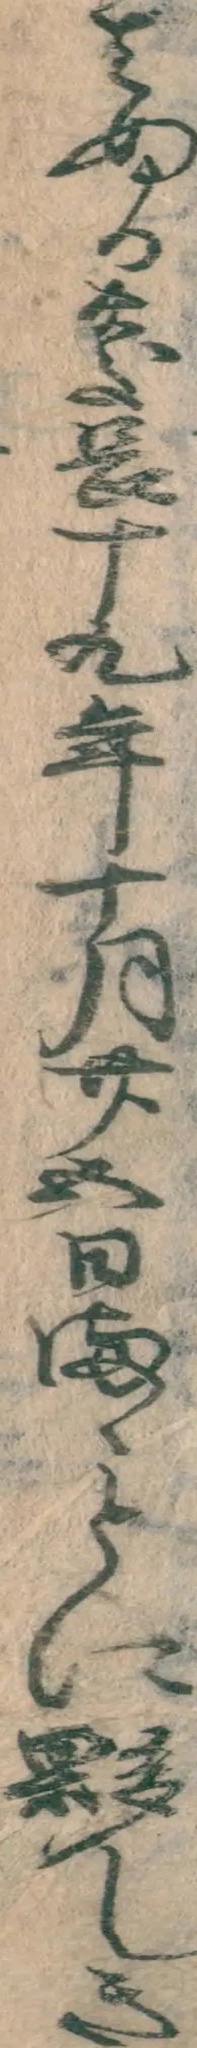はぬる慶長十九年十月廿五日まことに夥しき

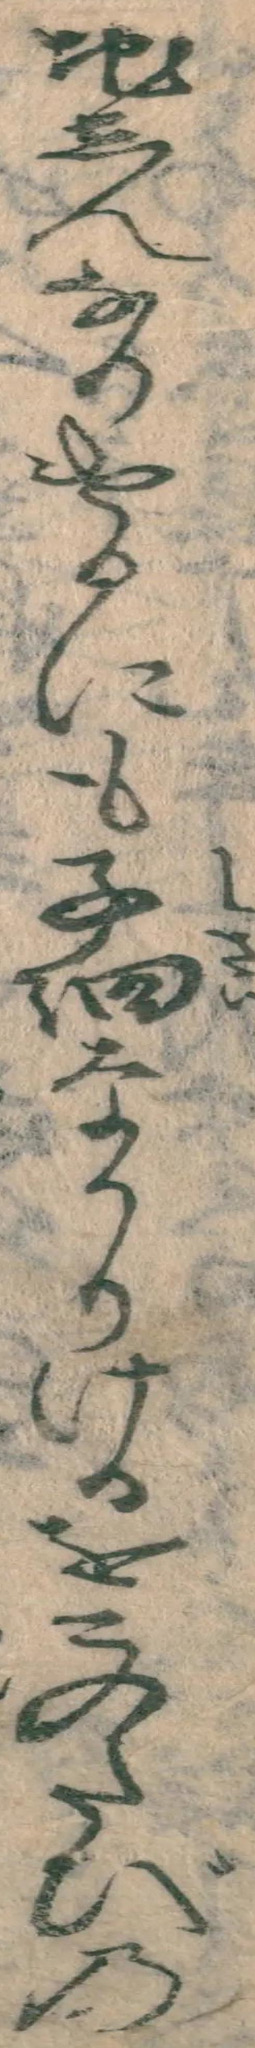地しんなりけるにも子細なかりけるをこのたびの
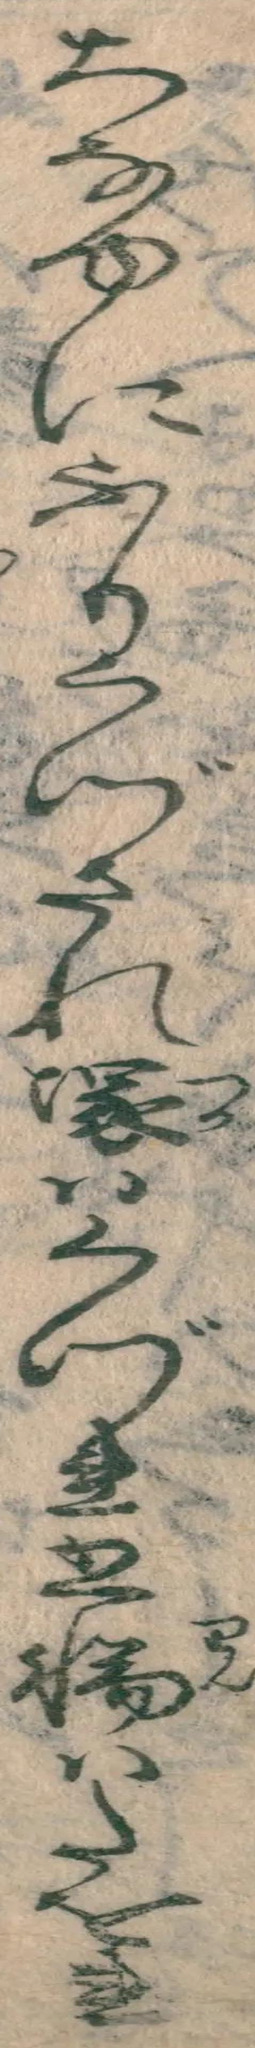大なゆにふりくづされ塚はくづれ五輪はたをれ
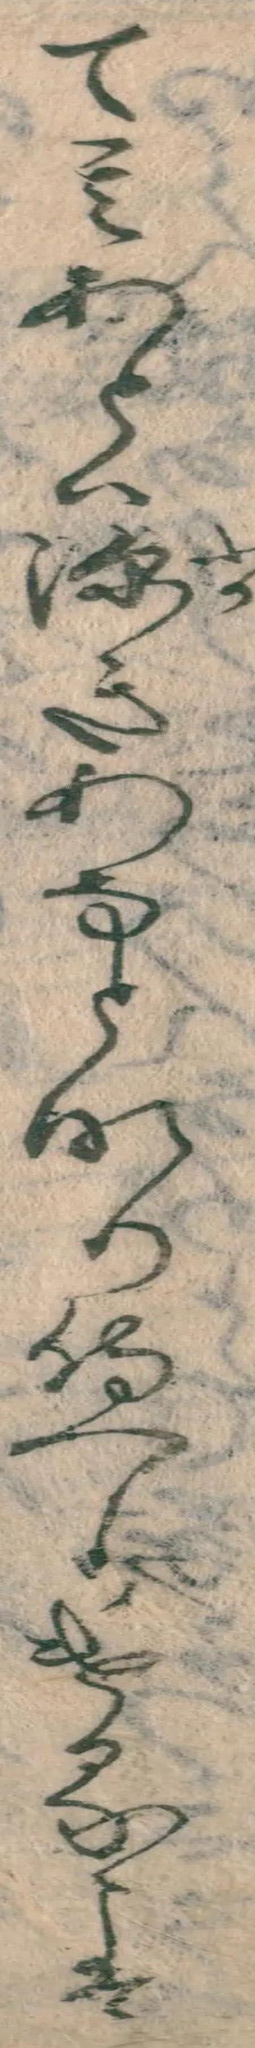て其あとは深きあなとなり侍へりけるとそ
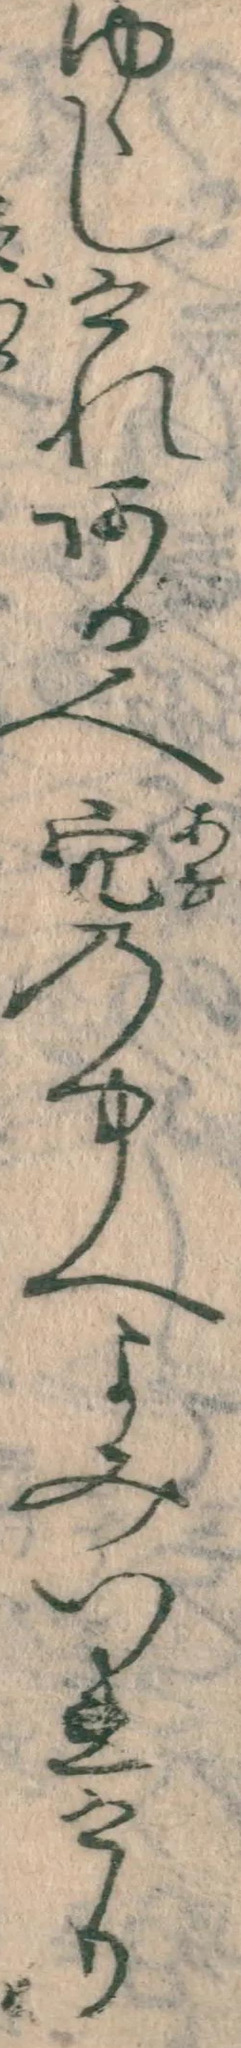ゆゝしけれある人穴の中へよみいれけり
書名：艱難目異志. 上,下
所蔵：国立国会図書館 National Diet Library, JAPAN
